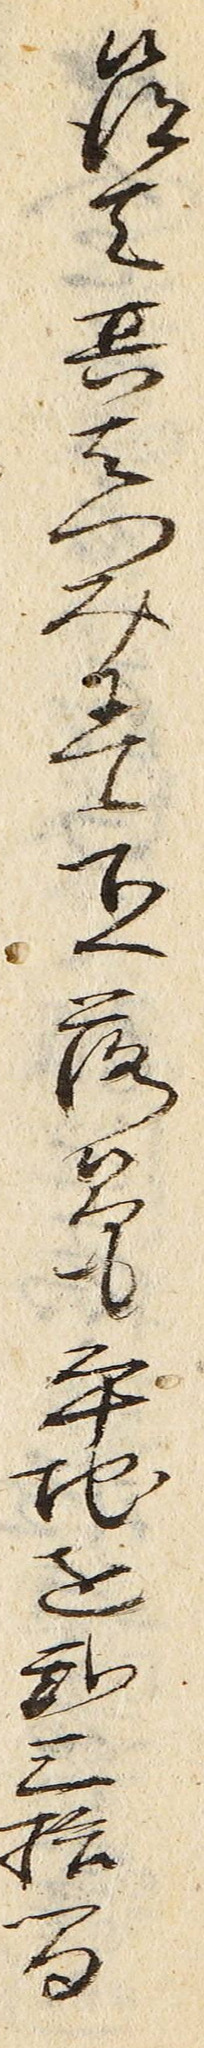候得は其はつみにて下へ落候ても平地を弐三拾間
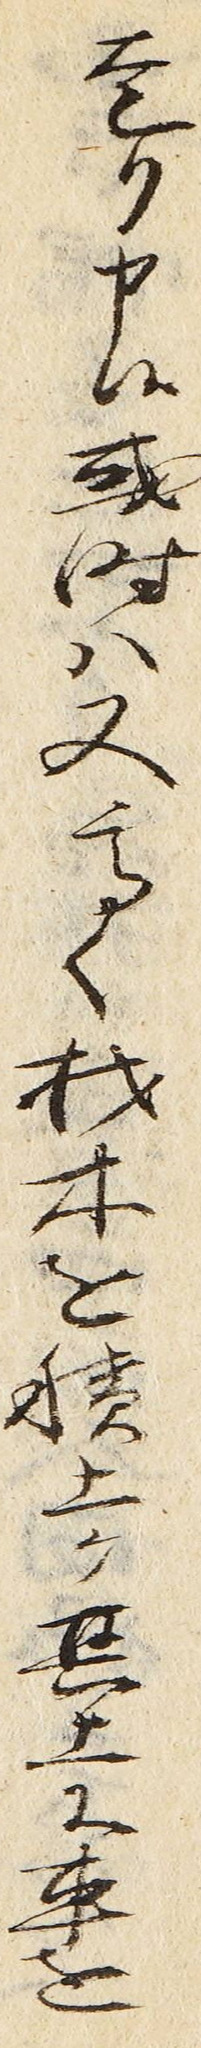走り申候或時は又高く材木を積上ケ其上に車を
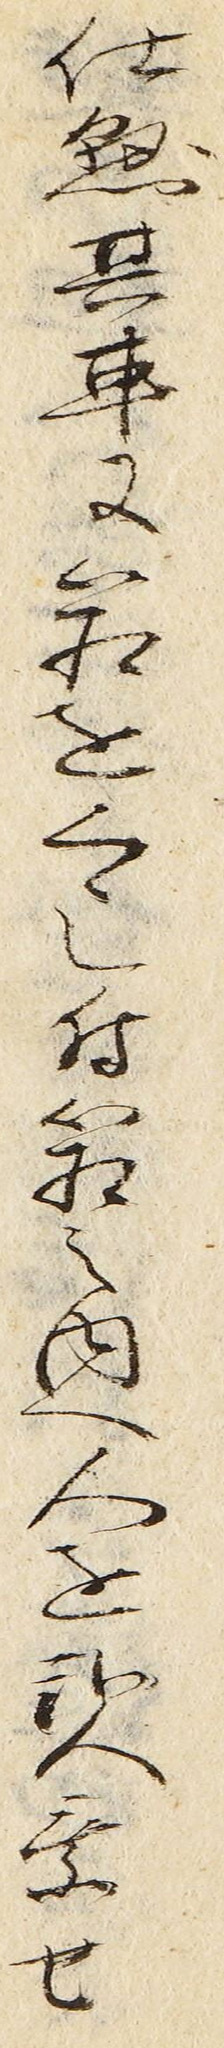仕懸其車に箱をくゝし付箱之内へ人を弐人乗せ
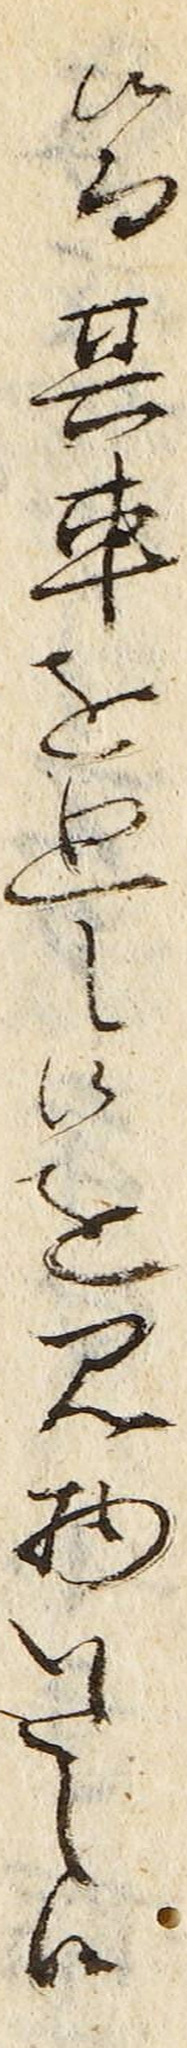候て其車を廻し候を見物いたし候
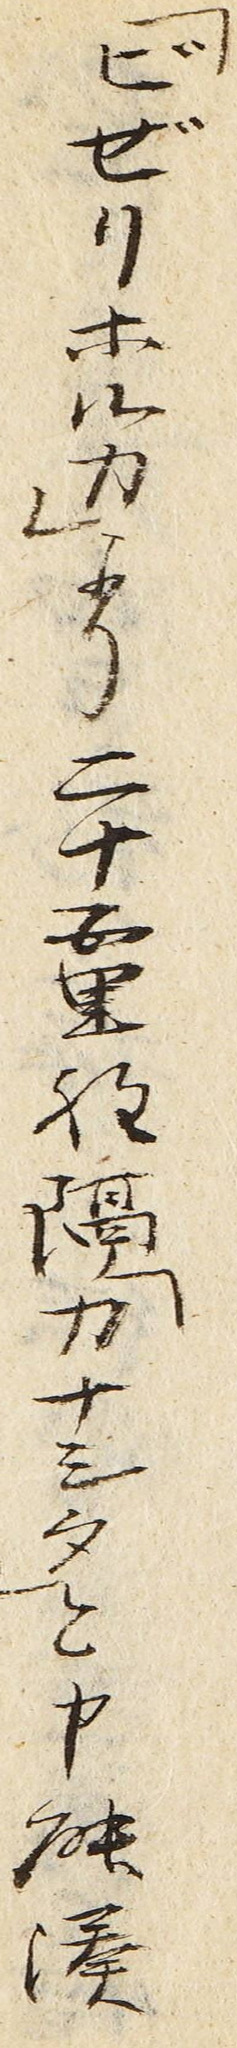「ビゼリホルカ」より二十五里程隔「カナシタ」と申能湊
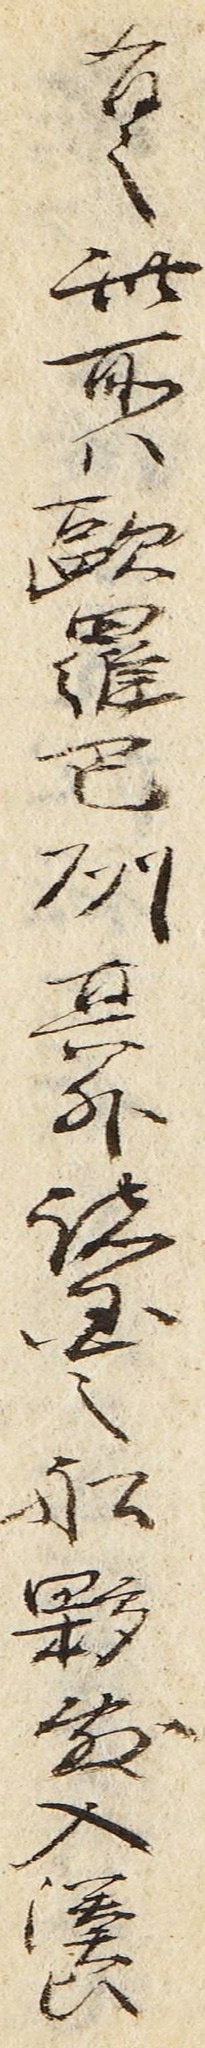有之此所は欧羅巴州其外諸国之船夥敷入湊ひ
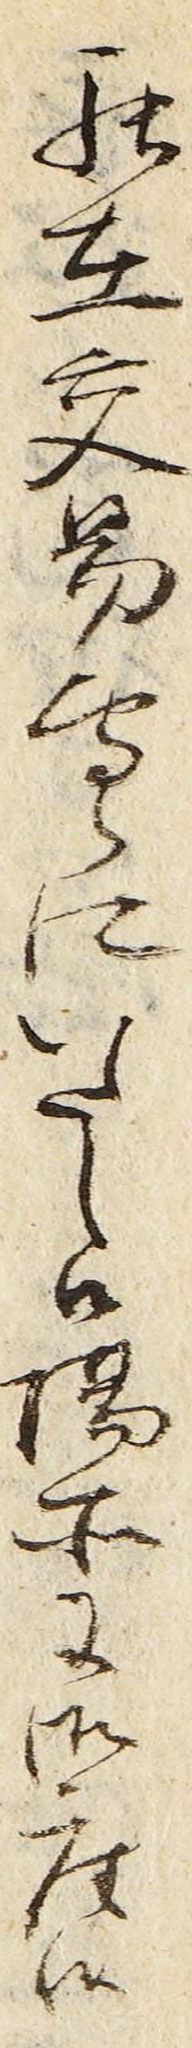罷在交易専らにいたし候場所に御座候
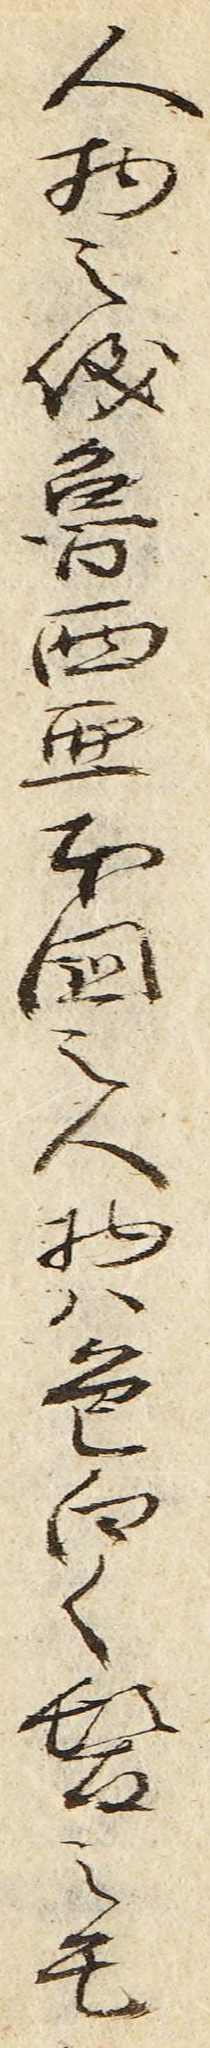人物之儀魯西亜本国之人物は色白く髪之毛
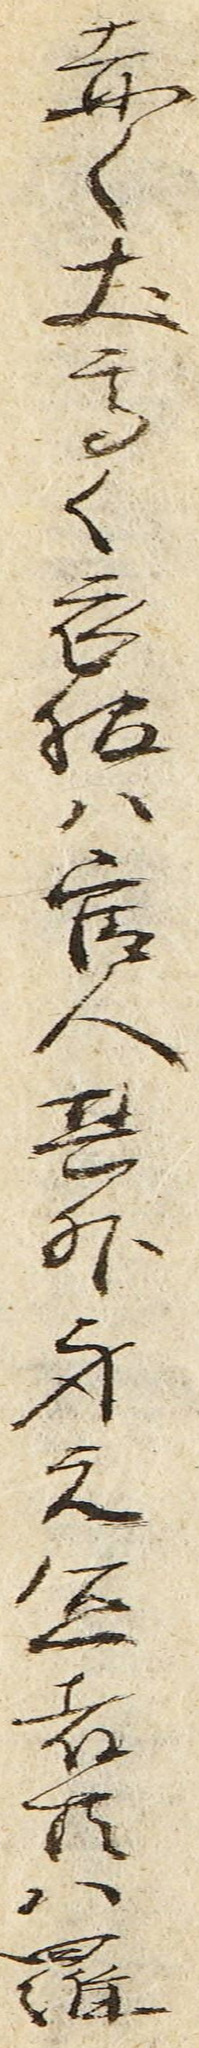赤く丈高く衣服は官人其外身元宜者共は羅
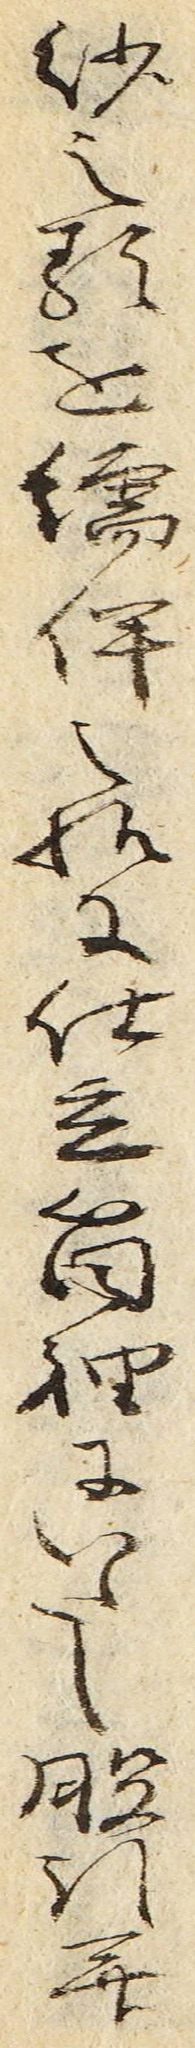紗之類を襦袢之様に仕立筒袖にいたし股引并

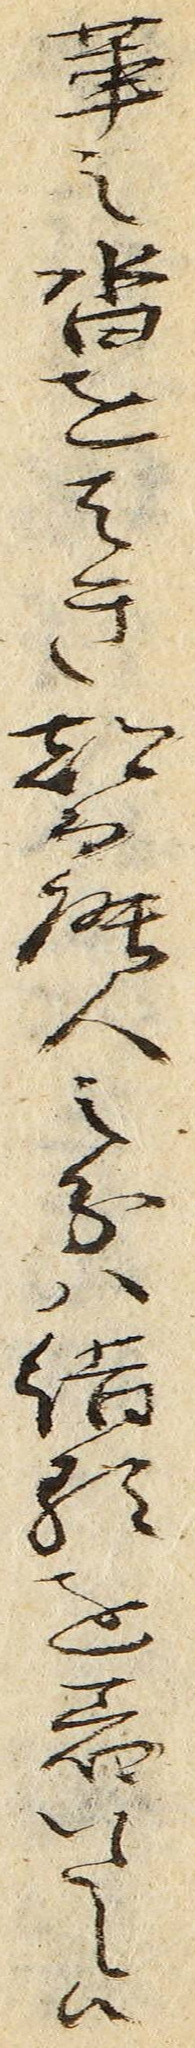革之沓をはき都て能人之分は絹類を着いたし候
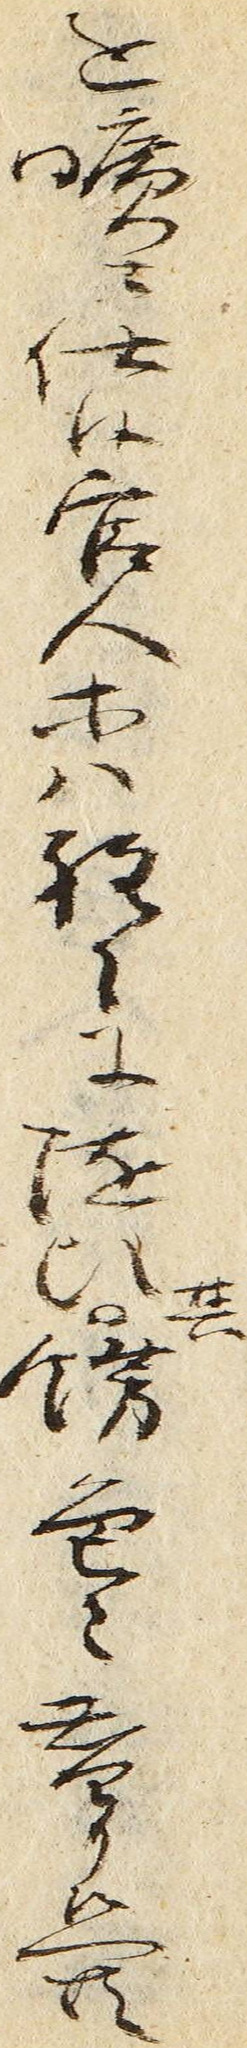を曠に仕候官人等は程々に随ひ其餝色々暮も候へ共
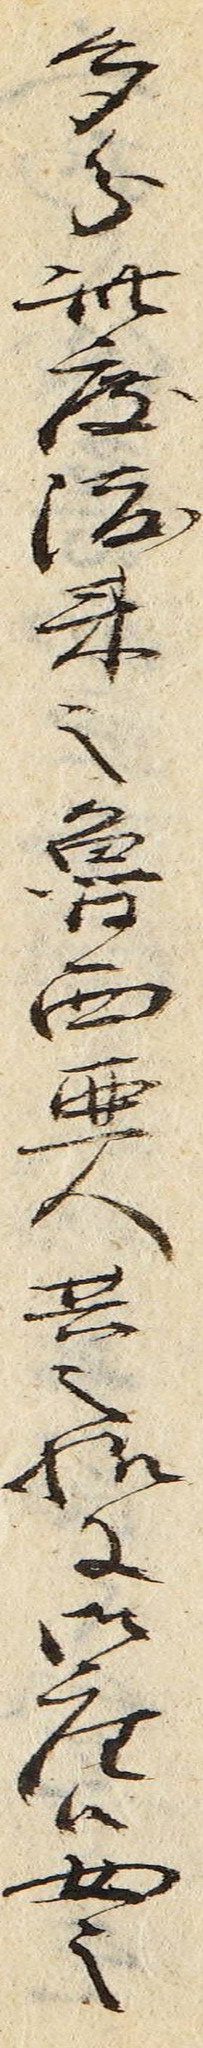多分此度渡来之魯西亜人共之様に御座候女之
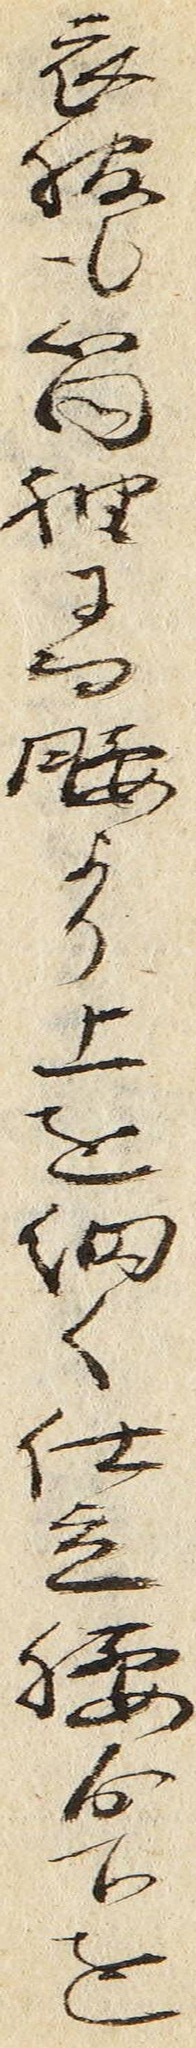衣服も筒袖にて腰より上を細く仕立腰ゟ下を
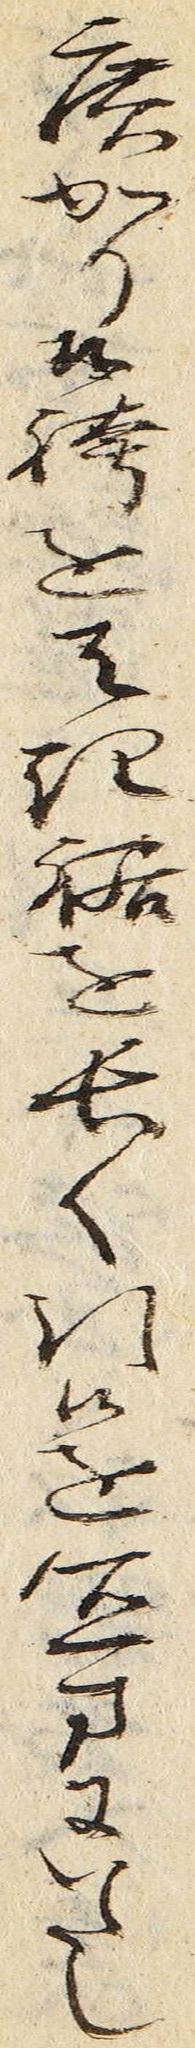広かり候袴をはき裾を長く引候を宜方にいたし
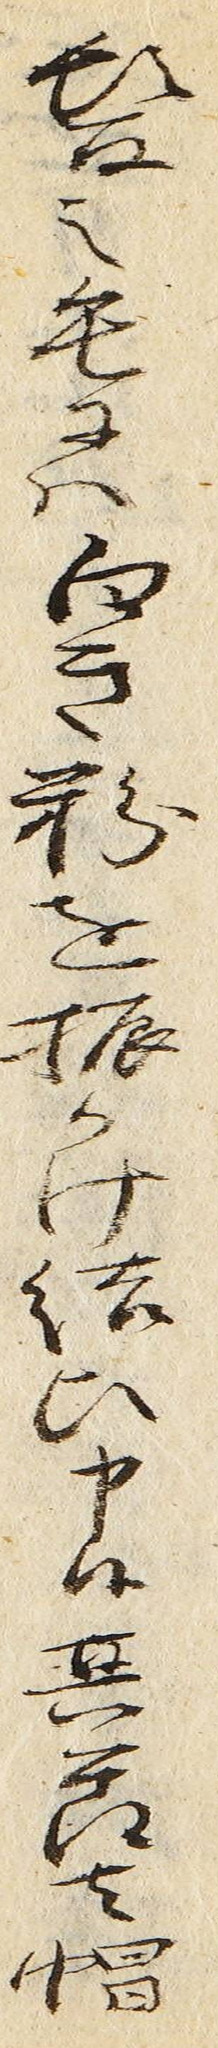髪之毛には白き粉を振かけ結ひ申候其節は帽
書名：漂民後記
